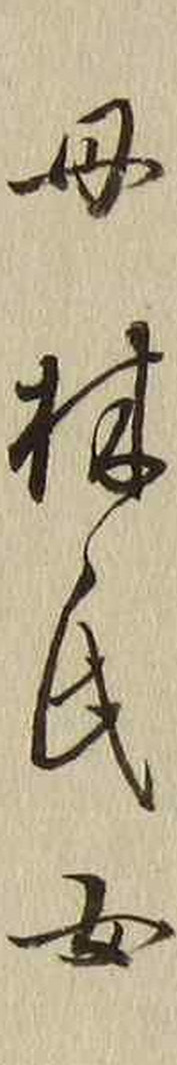母林氏女
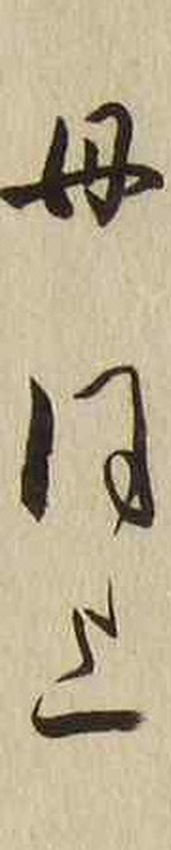母同上

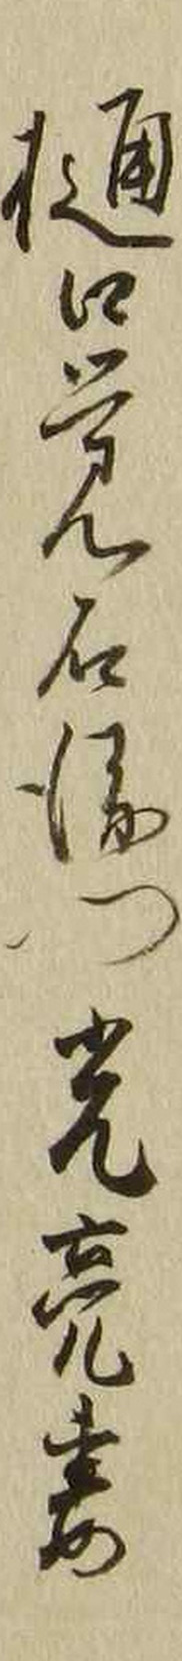女樋口覚右衛門光亮妻
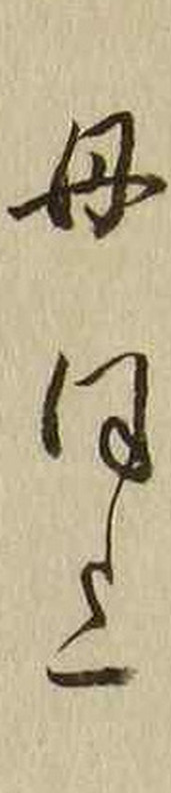母同上
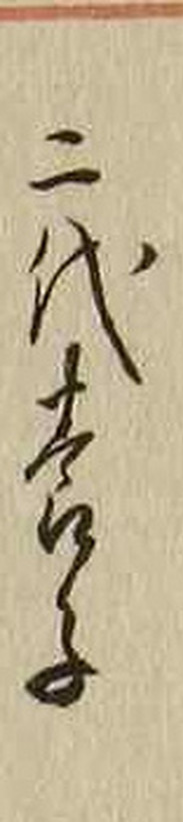二代養子
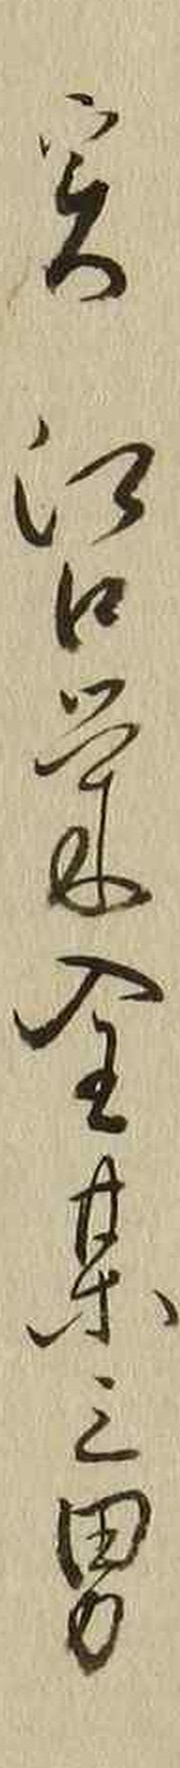実江口栄全某三男
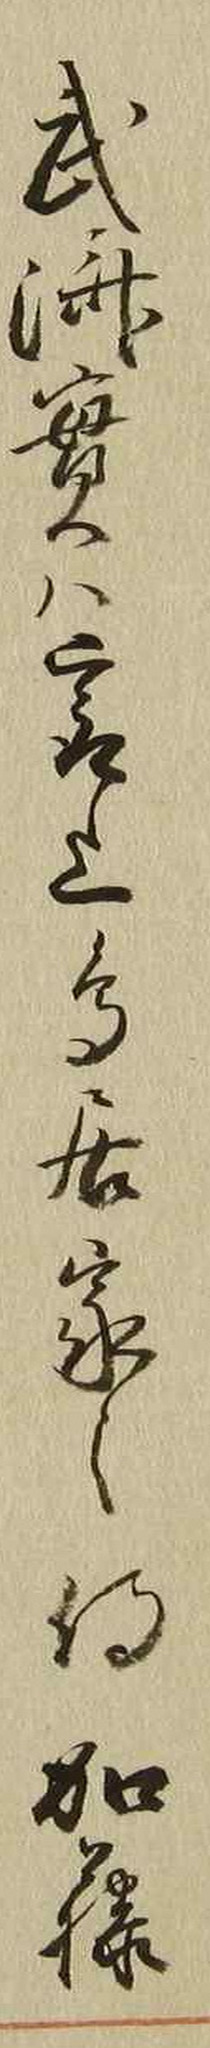武濟実ハ最上鳥居家之侍加藤
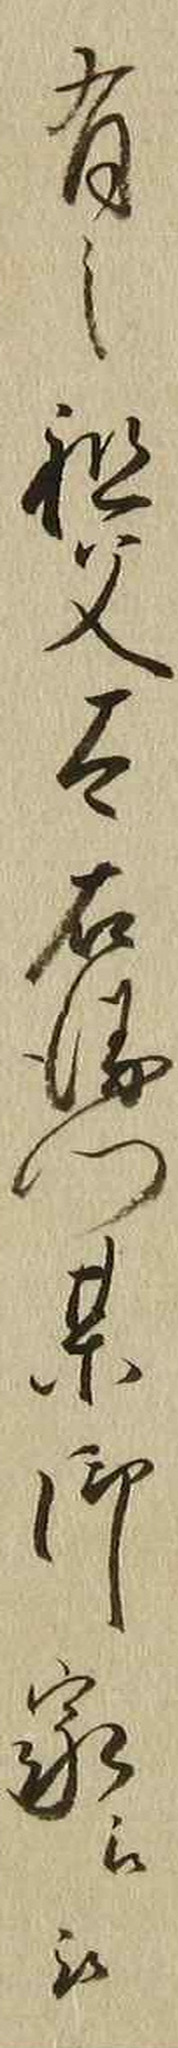有之祖父太右衛門某御家江被
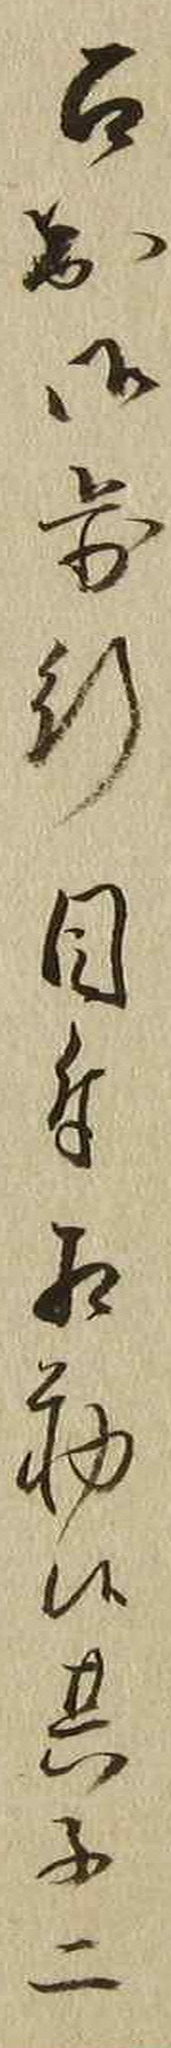召出御歩行目付相勤候其子二
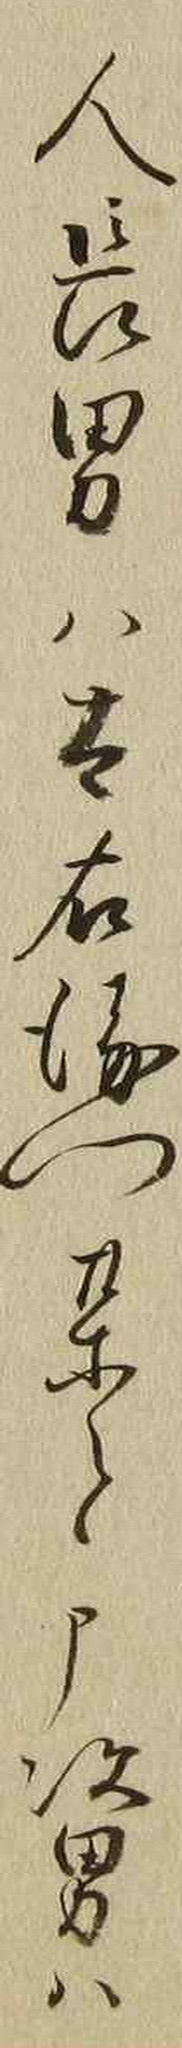人長男ハ太右衛門某と申次男ハ
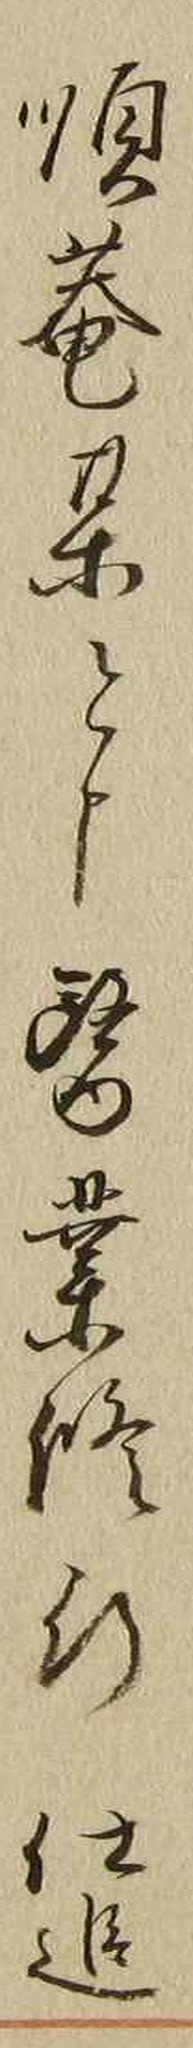順庵某と申医業修行仕追
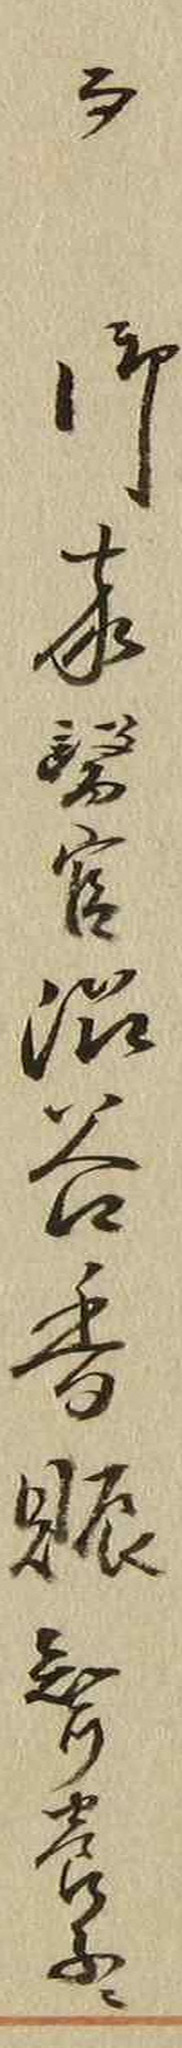而御家医官渋谷香賑聟養子ニ
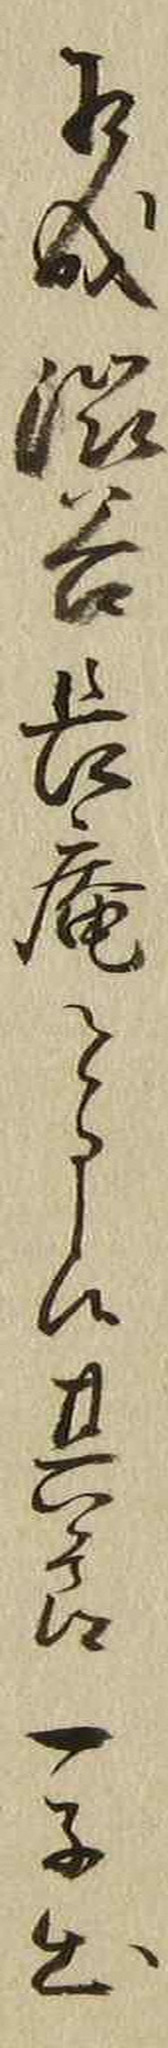相成渋谷長庵と申候其節一子出
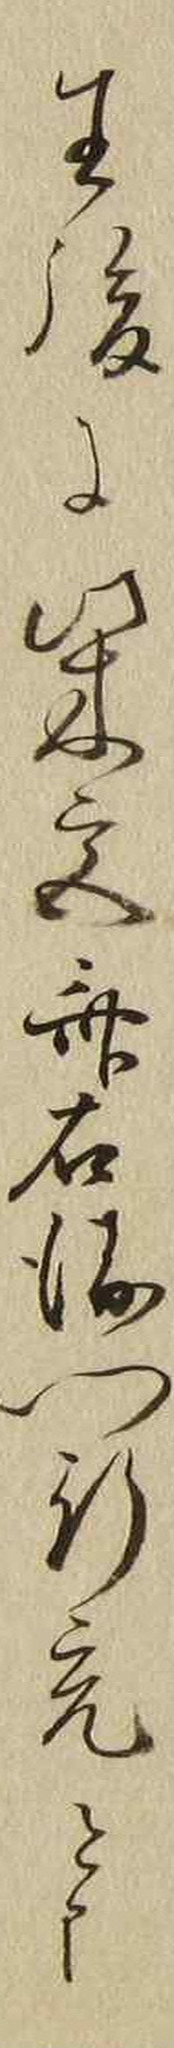生後に柴宮斉右衛門行充と申
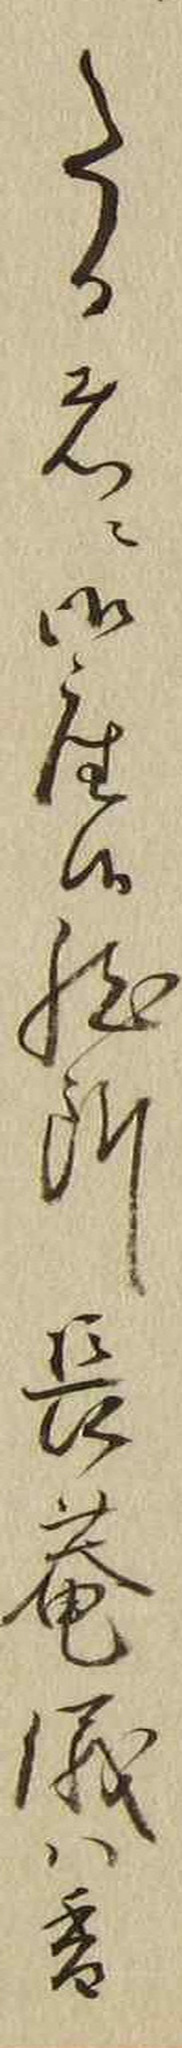たる者ニ御座候然所長庵儀ハ香
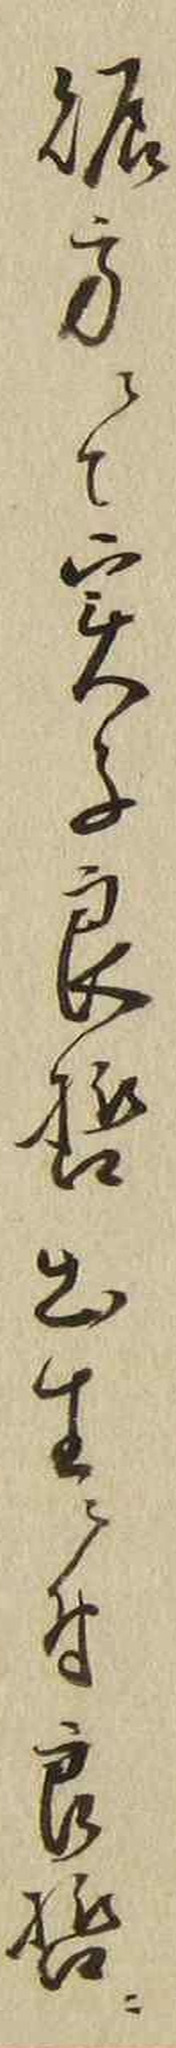賑方ニて実子良哲出生ニ付良哲ニ
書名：諸士系譜　巻之68　を之部2
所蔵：会津若松市立会津図書館
